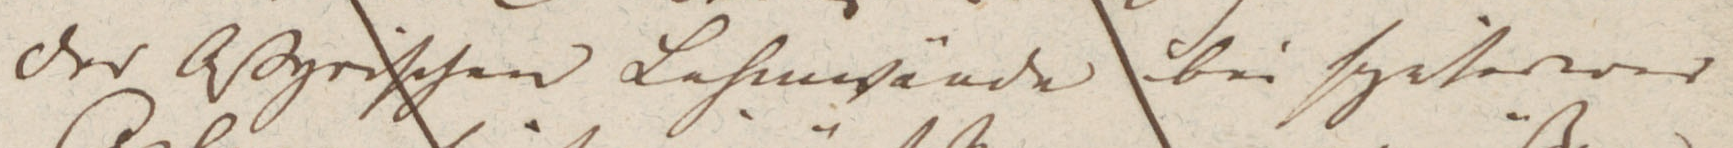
der Assyrischen Lehmwände bei späterer
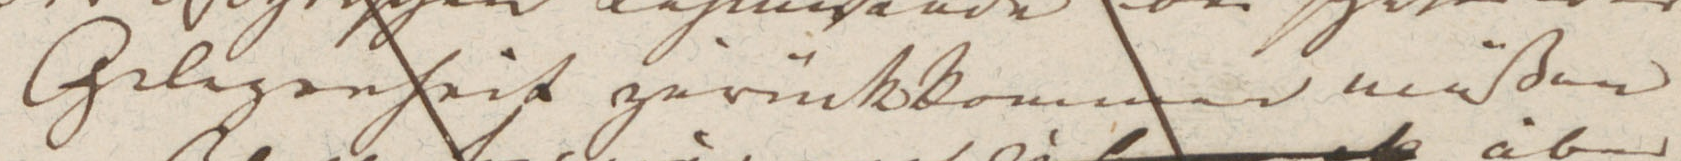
Gelegenheit zurückkommen müssen
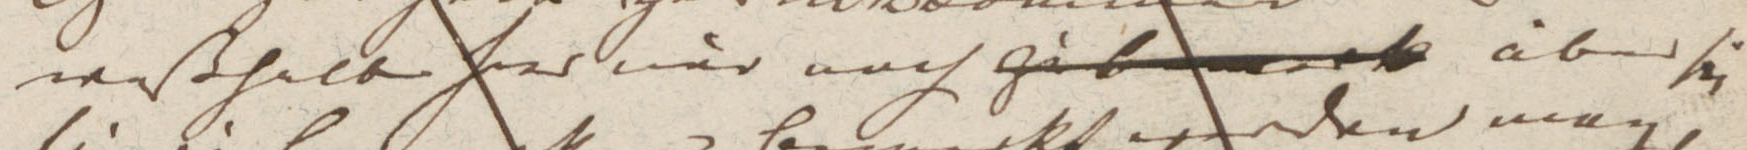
wesshalb hier nur noch zu bemerk über sie
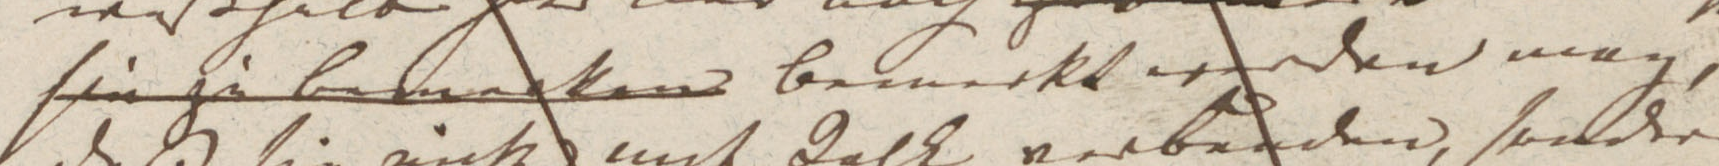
sie zu bemerken bemerkt werden mag,
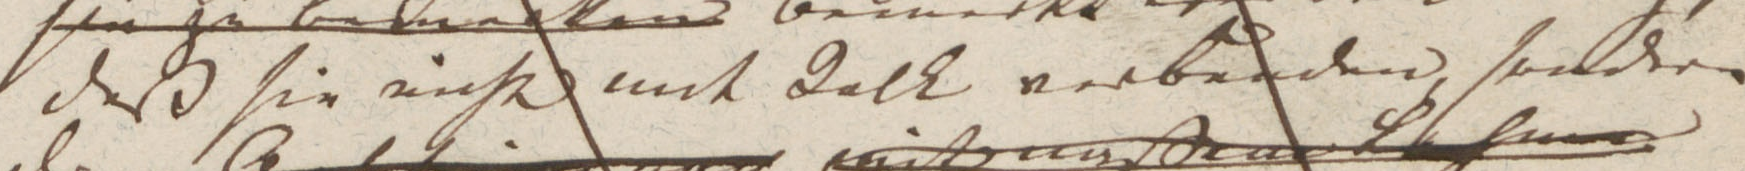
dass sie nicht mit Kalk verbunden, sondern
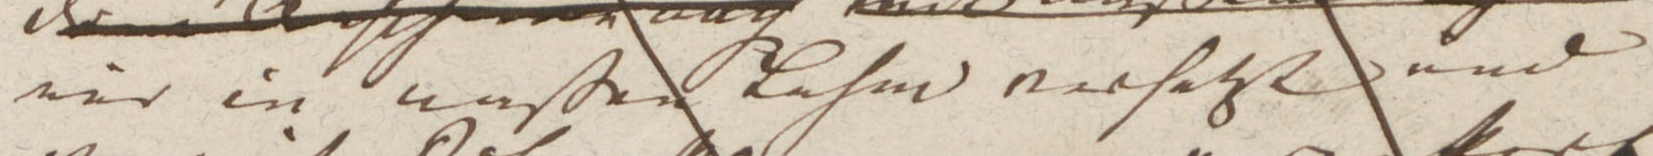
nur in nassen Lehm versetzt und
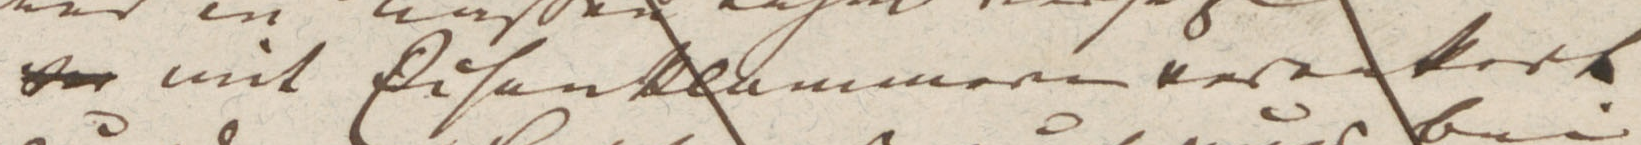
ver mit Eisenklammern verankert
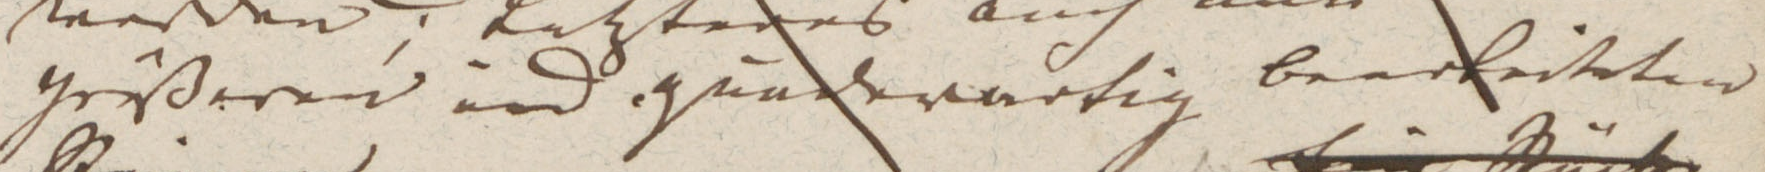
grösseren und quaderartig bearbeiteten
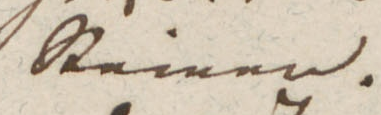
Steinen.
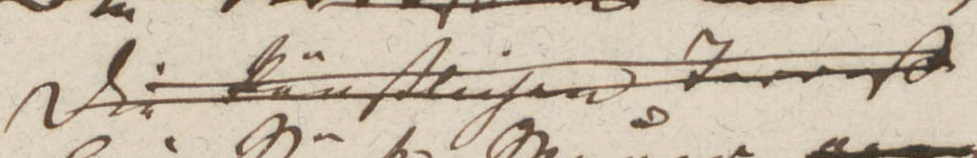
Die künstlichen Terrass
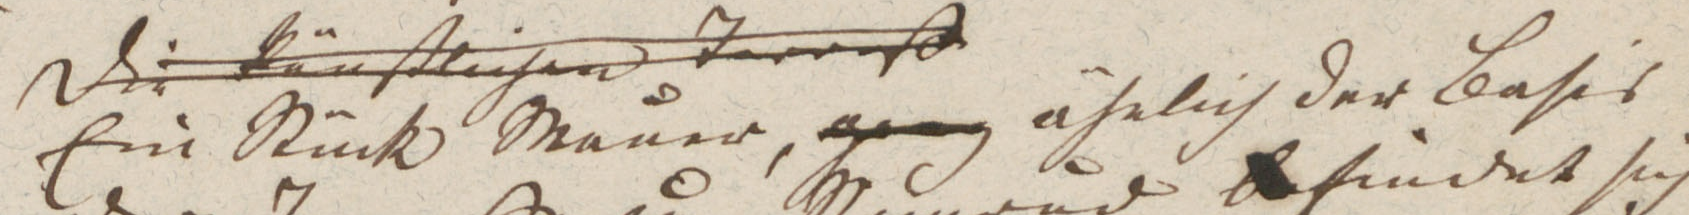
Ein Stück Mauer, ganz ähnlich der Basis
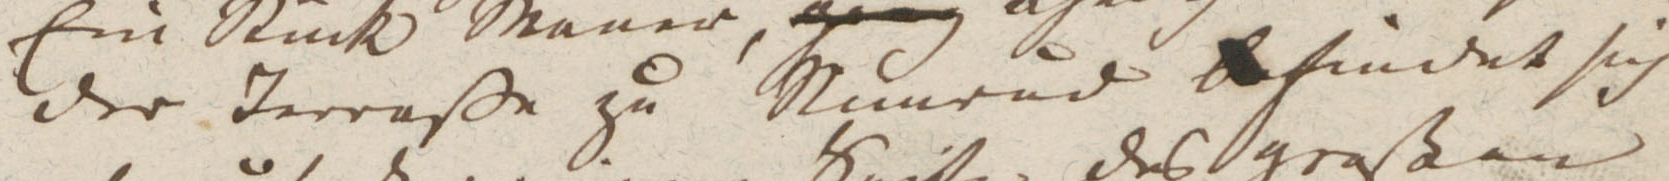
der Terrasse zu Nimrud befindet sich
